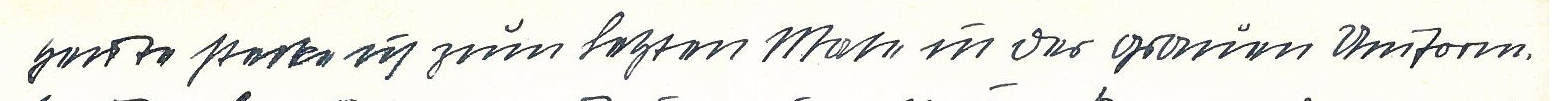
Heute stecke ich nun zum letzten Male in der grauen Uniform.
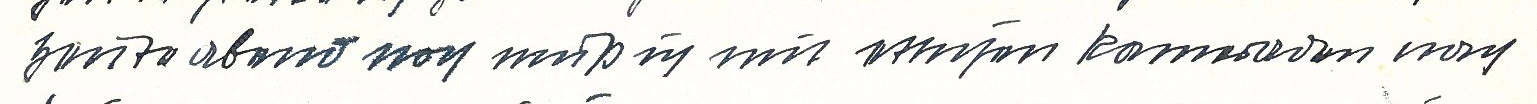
Heute abend noch muß ich mit etlichen Kameraden nach
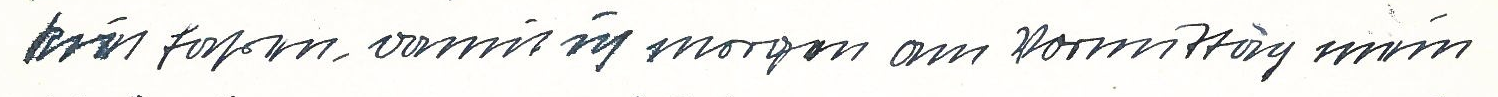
Kiel fahren, damit ich morgen am Vormittag mein
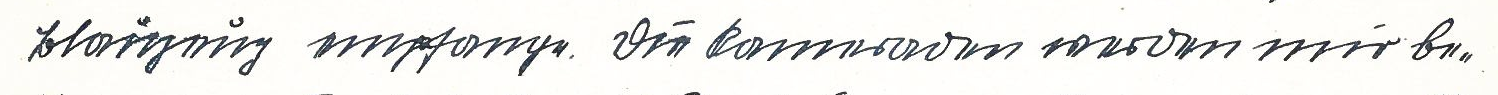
Blauzeug empfange. Die Kameraden werden mir be¬
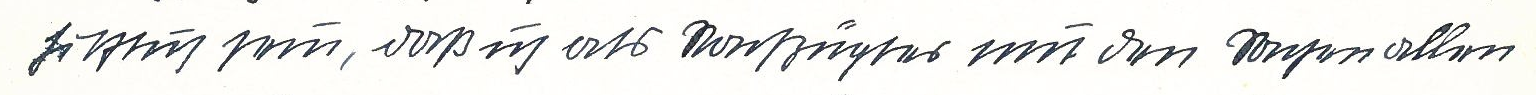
hilflich sein, daß ich als Nachzügler mit den Sachen allen
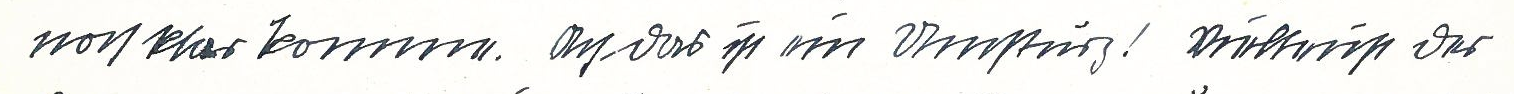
doch klar komme. Ach, das ist ein Umsturz! Vielleicht der
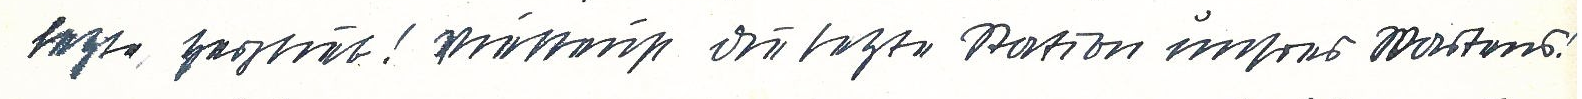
letzte, Herzlieb! Vielleicht die letzte Station unsres Wartens!
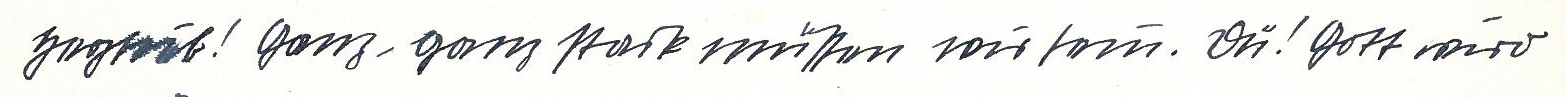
Herzlieb! Ganz, ganz stark müssen wir sein. Du! Gott wird
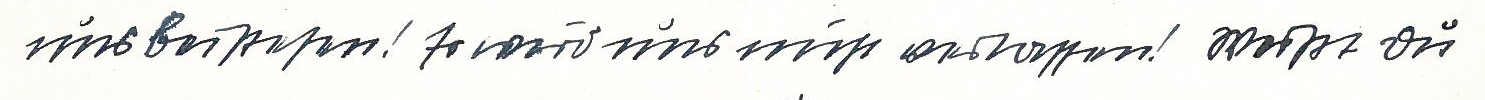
uns beistehen! Er wird uns nicht verlassen! Weißt Du
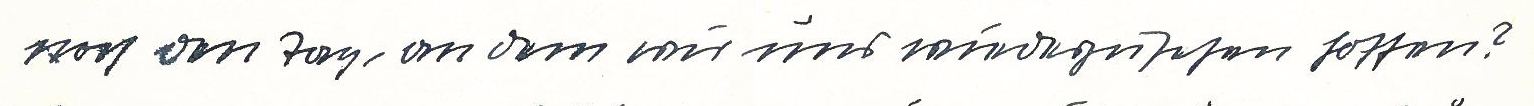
noch den Tag, an dem wir uns wiederzusehen hoffen?
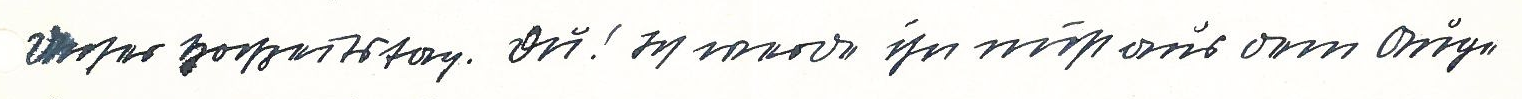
Unser Hochzeitstag. Du! Ich werde ihn nicht aus dem Auge
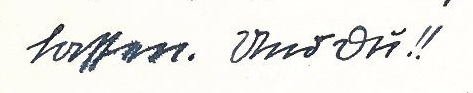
lassen. Und Du!!
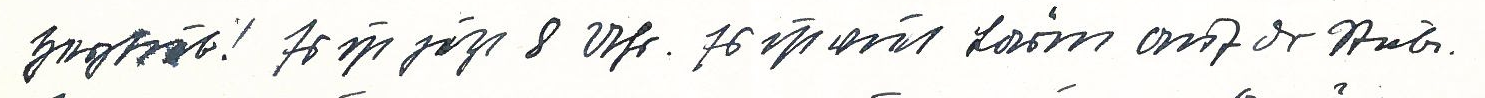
Herzlieb! Es ist jetzt 8 Uhr. Es ist viel Lärm auf der Stube.
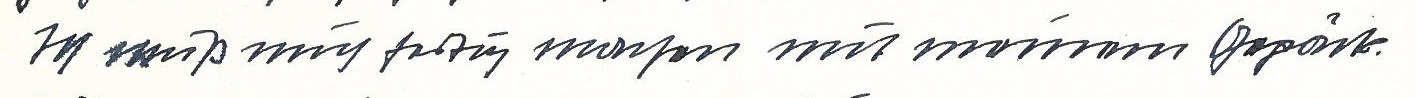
Ich muß mich fertig machen mit meinem Gepäck.
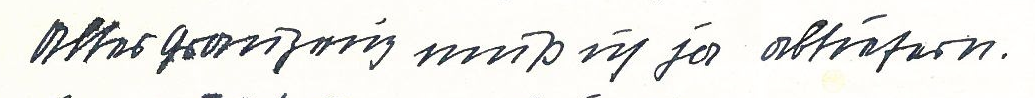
Alles Grauzeug muß ich ja abliefern.
